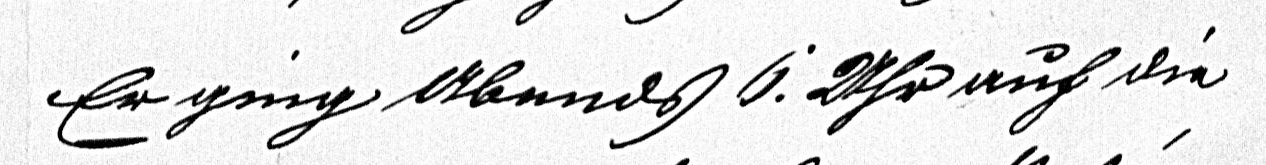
Er ging Abends 6. Uhr auf die
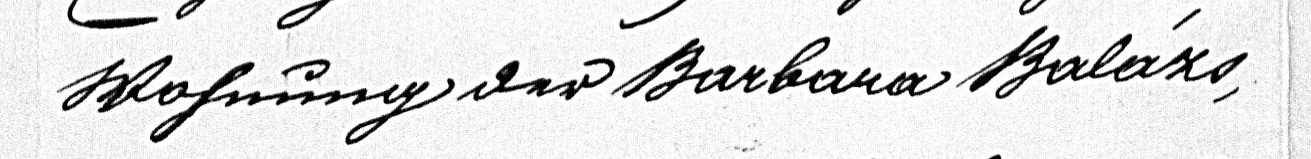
Wohnung der Barbara Balázs,
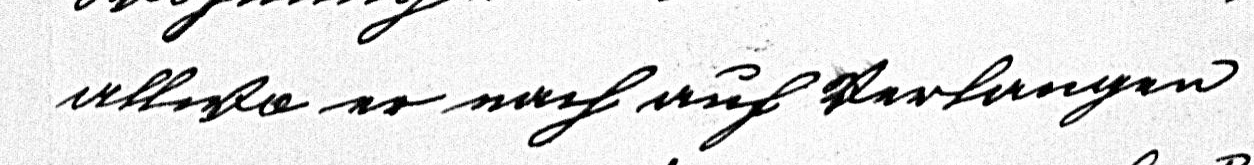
allwo er nach auf Verlangen
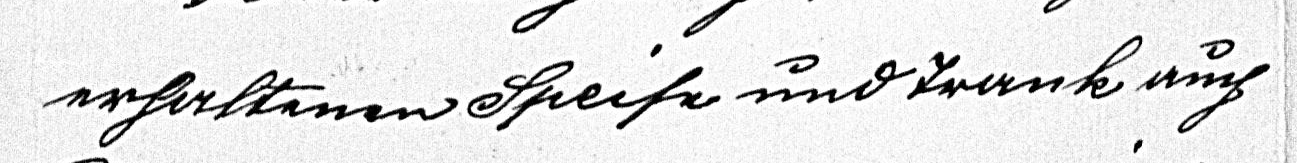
erhaltenen Speise und Trank auch
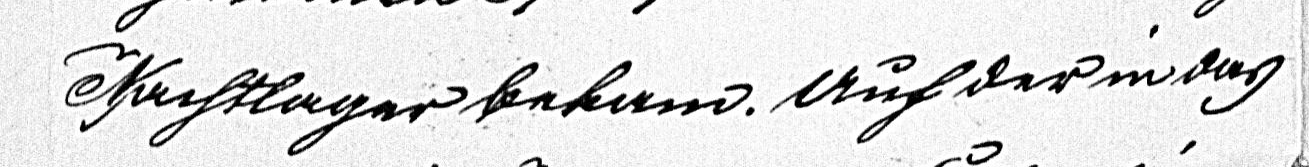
Nachtlager bekam. Auf der in das
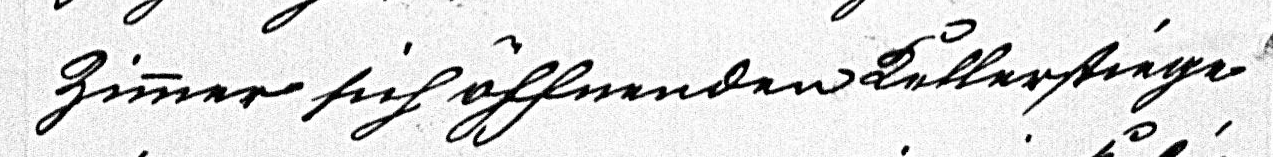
Zimmer sich öffnenden Kellersteige
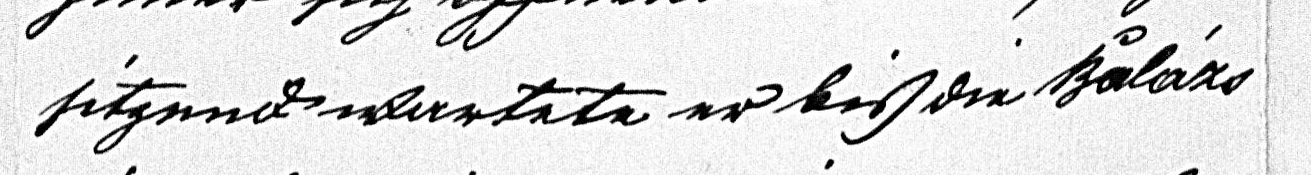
sitzend wartete er bis die Balázs
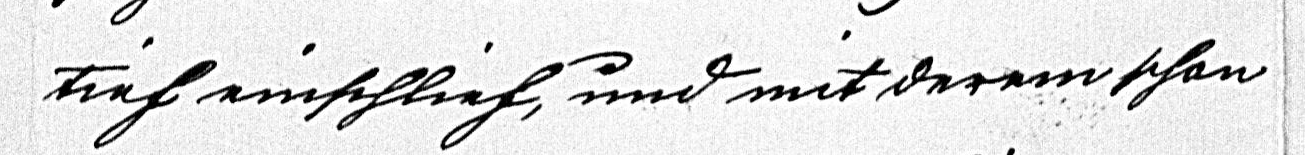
tief einschlief, und mit derem schon
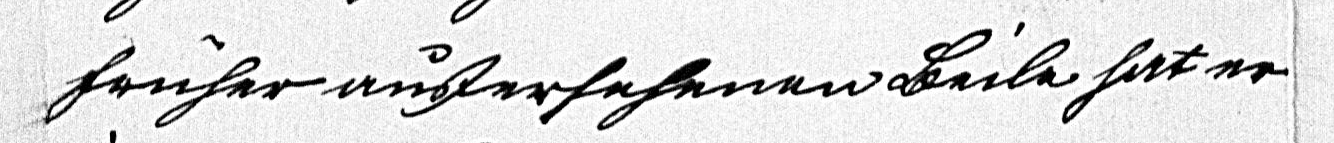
früher ausersehenen Beile hat er
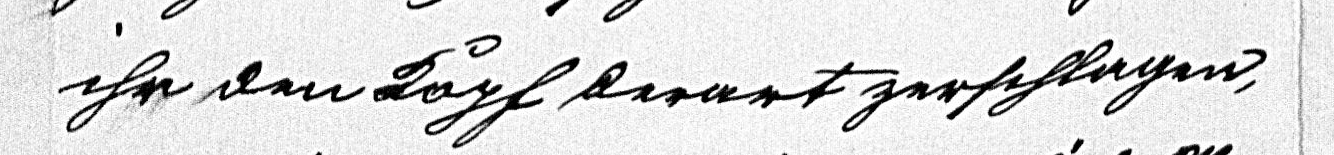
ihr den Kopf derart zerschlagen,
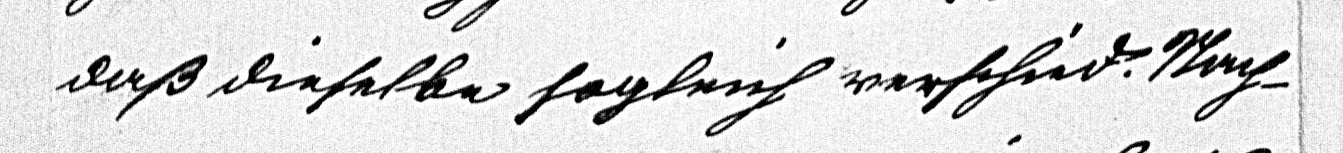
daß dieselbe sogleich verschied. Nach
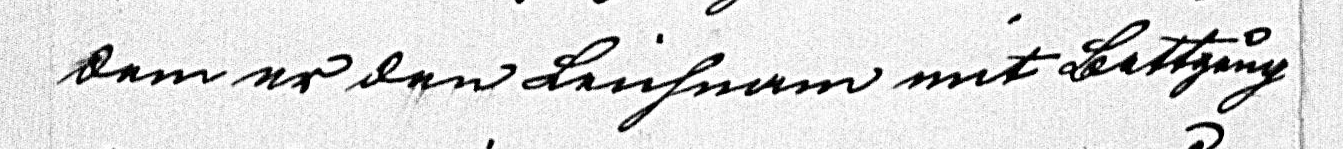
dem er den Leichnam mit Bettzeug
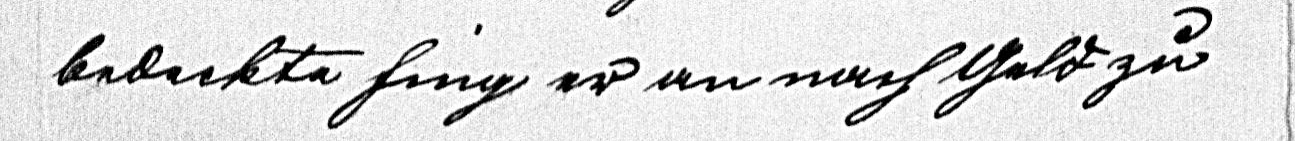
bedeckte fing er an nach Geld zu
